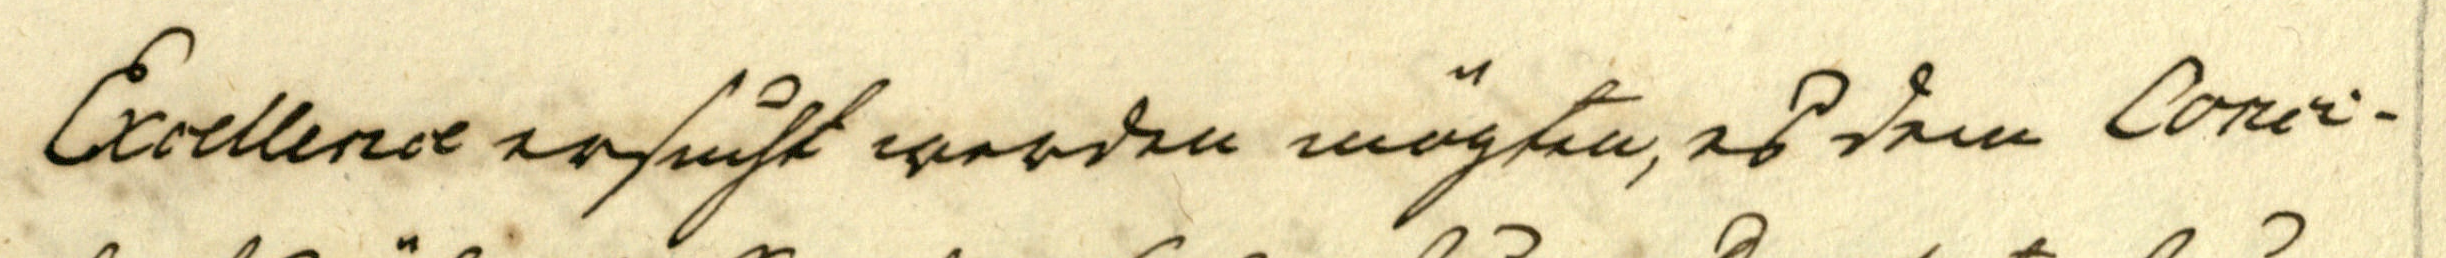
Excellence ersucht werden mögten, es dem Conci¬
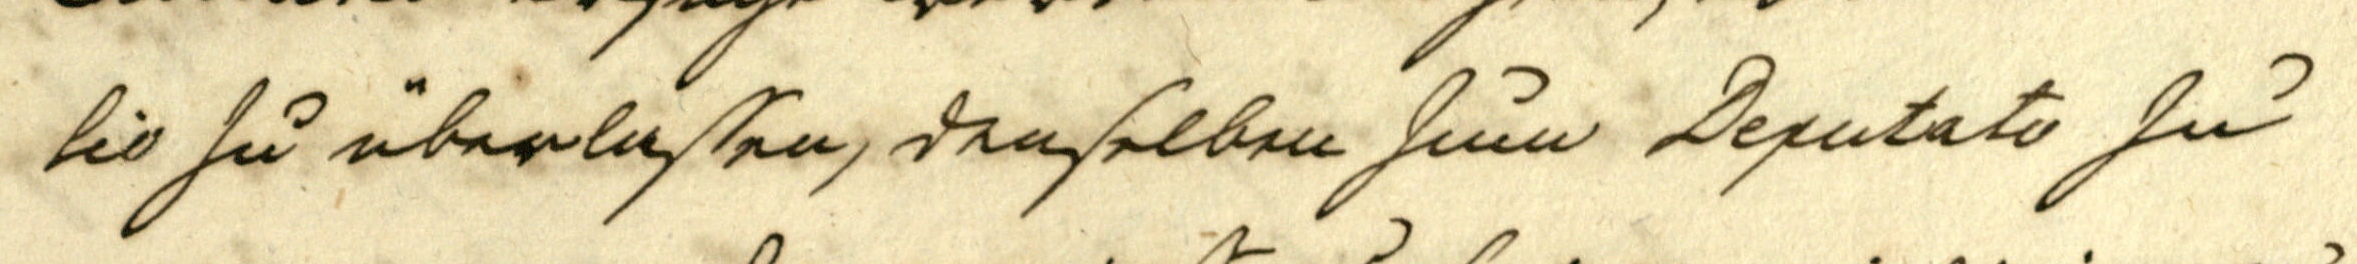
lio zu überlassen, denselben zum Deputato zu
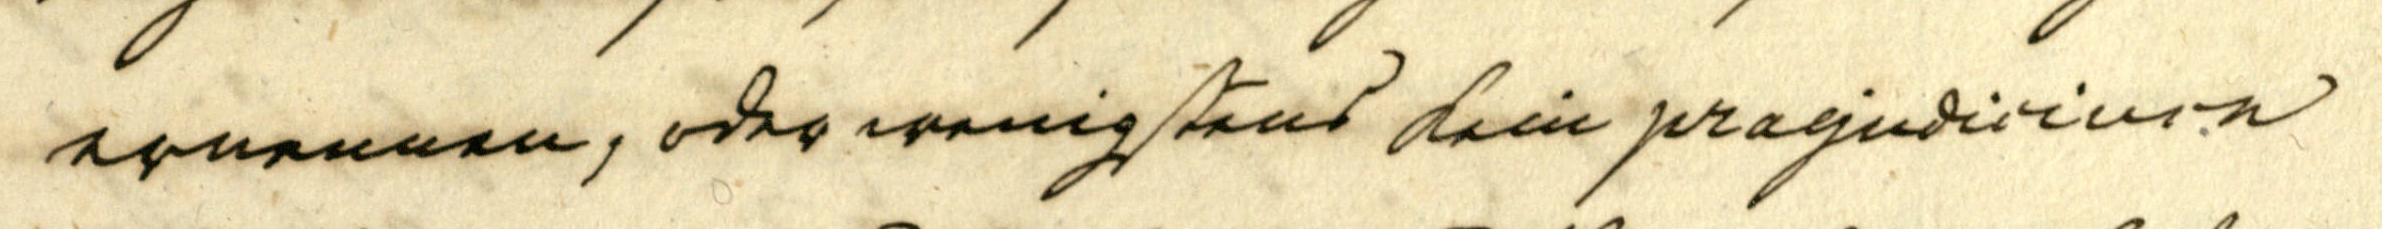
ernennen, oder wenigstens kein praejudicium
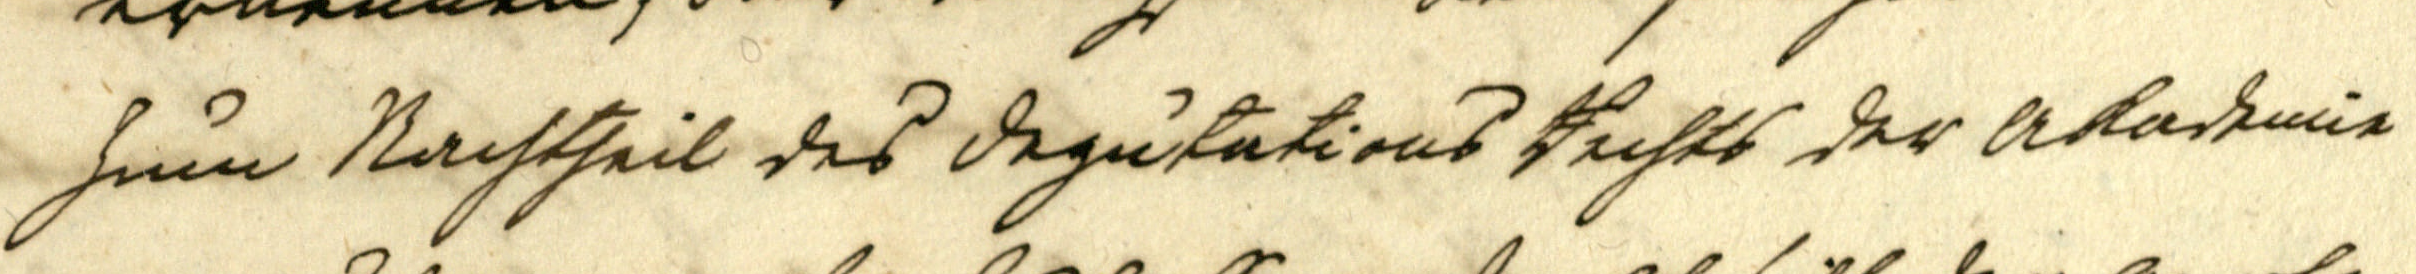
zum Nachtheil des Deputations Rechts der Akademie
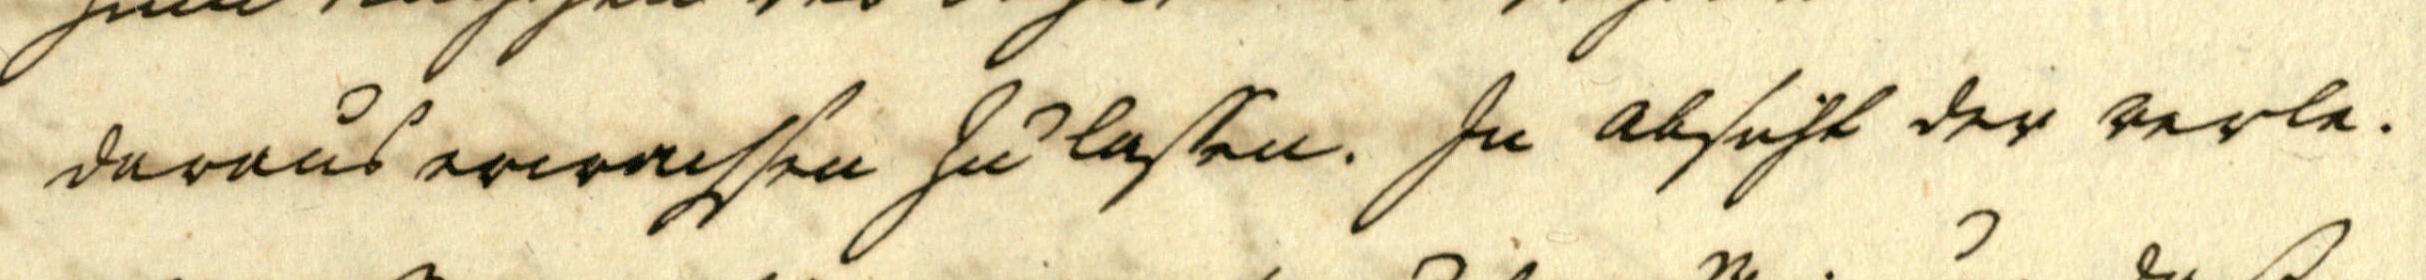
daraus erwachsen zu lassen. In Absicht der verle¬
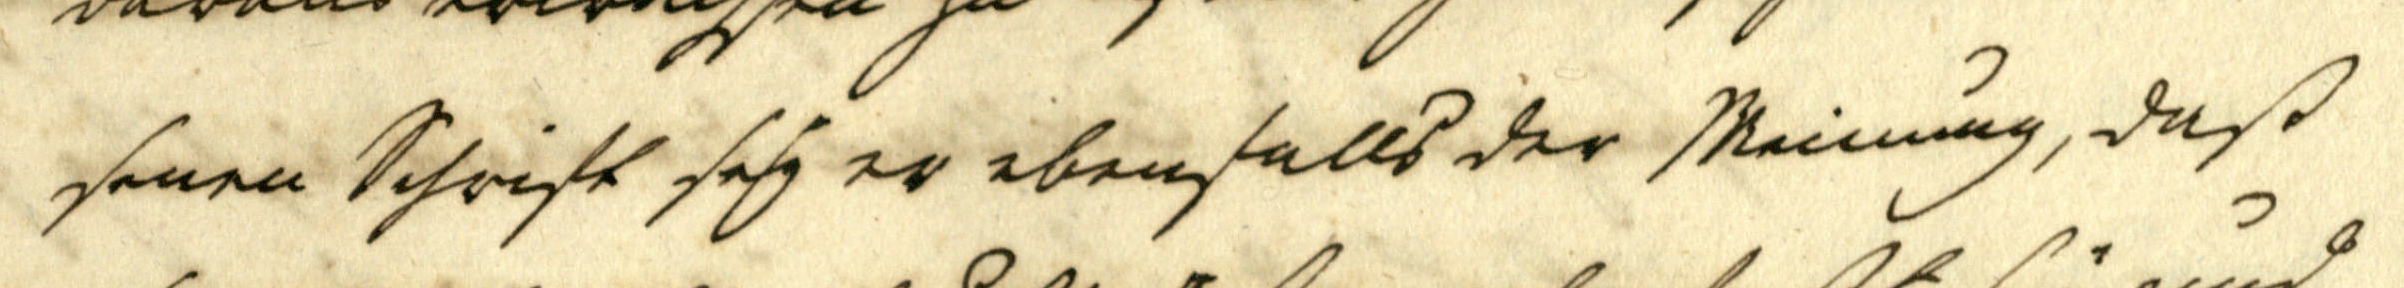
senen Schrift seÿ er ebenfalls der Meinung, daß
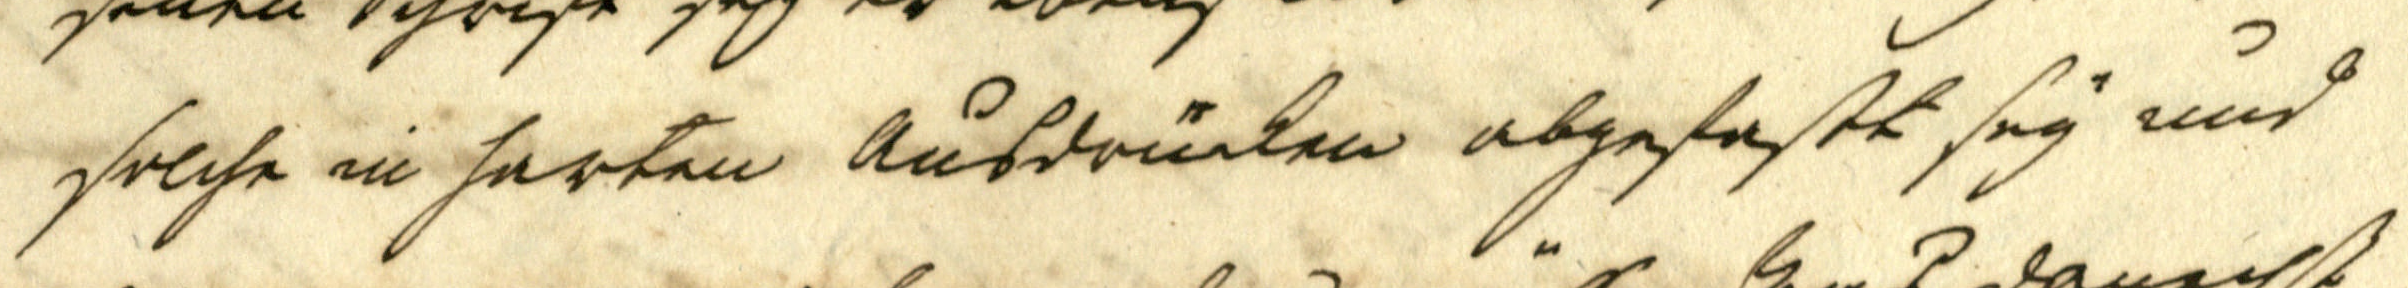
solche in harten Ausdrücken abgefaßt seÿ und
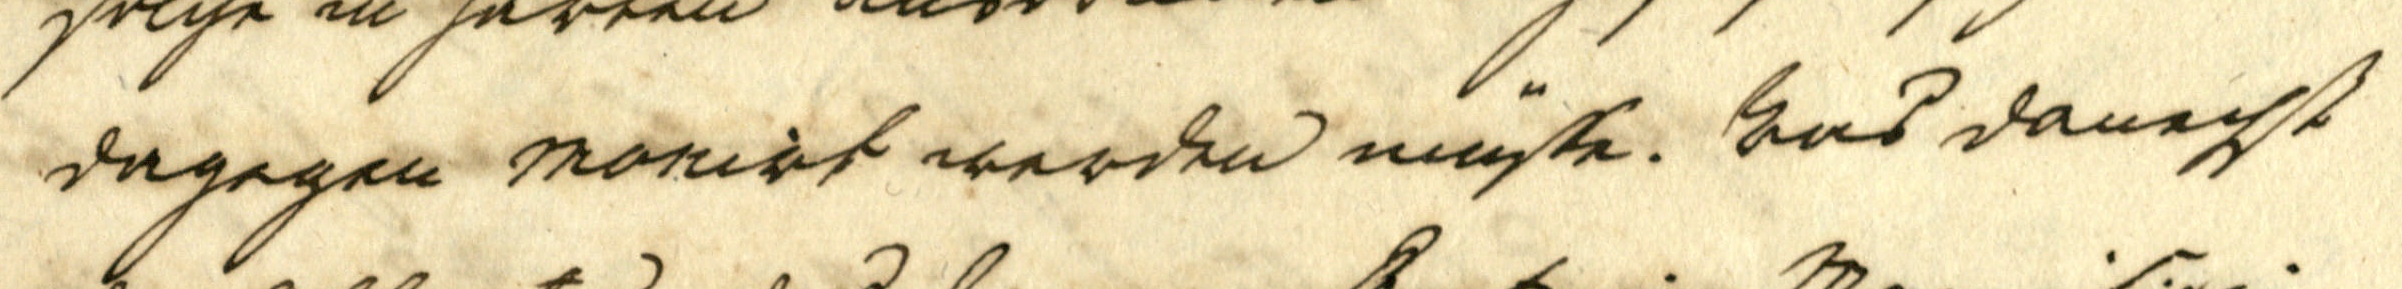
dagegen monirt werden müsse. Was danechst
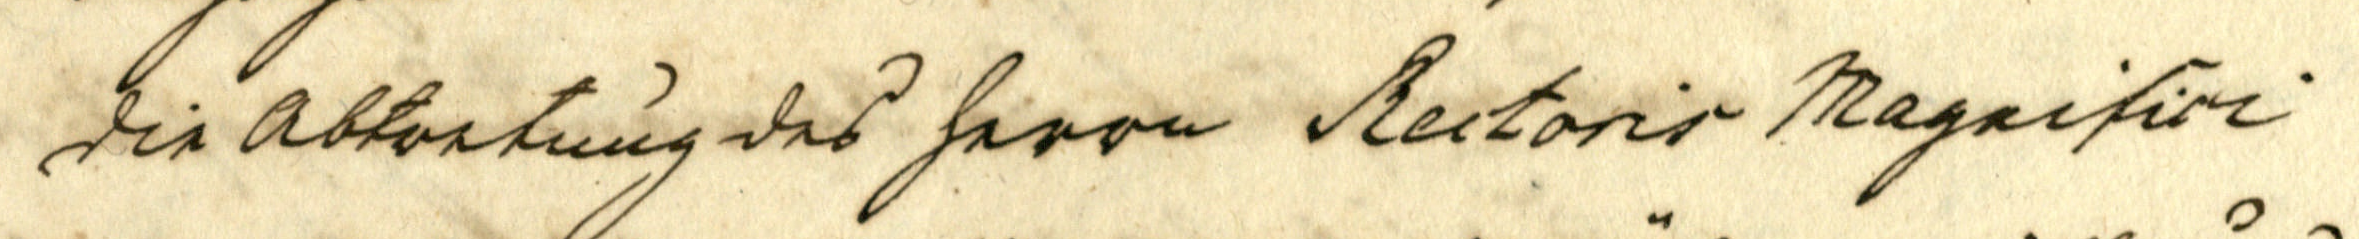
die Abtretung des Herrn Rectoris Magnifici
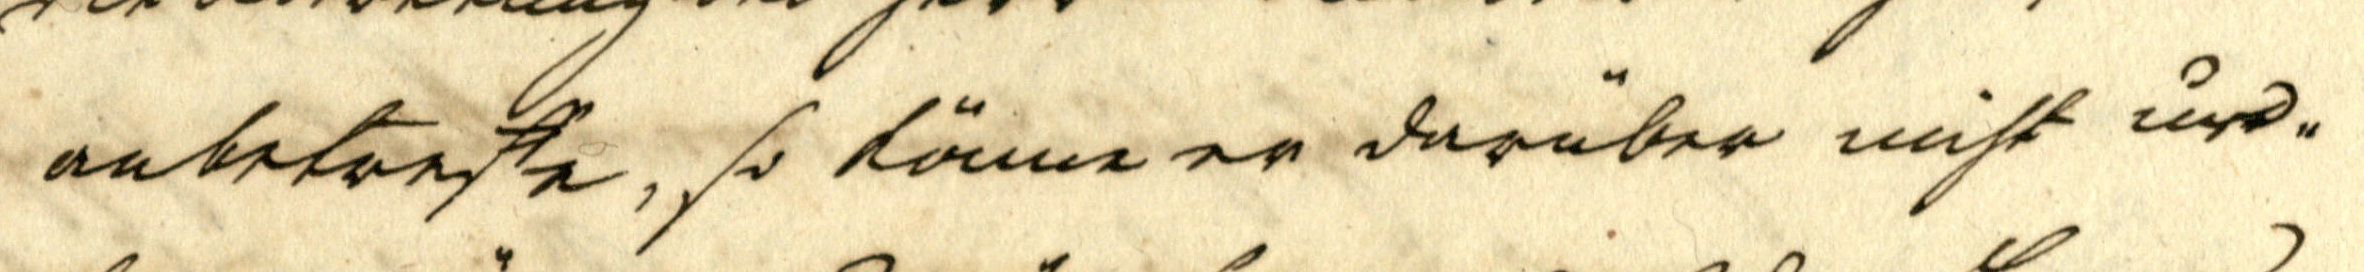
anbetreffe, so könne er darüber nicht ur¬
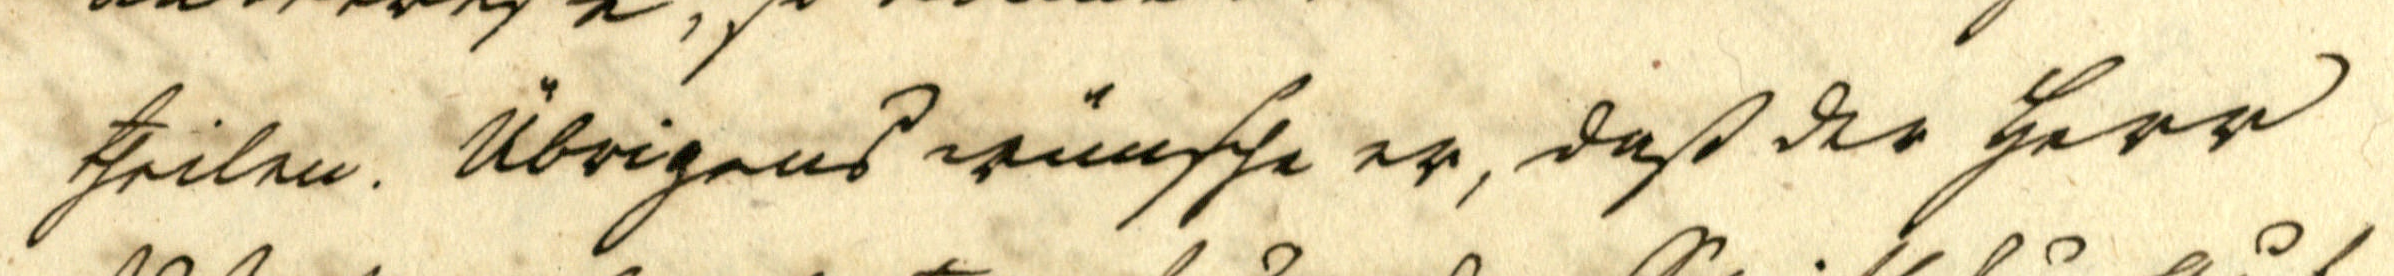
theilen. Übrigens wünsche er, daß der Herr
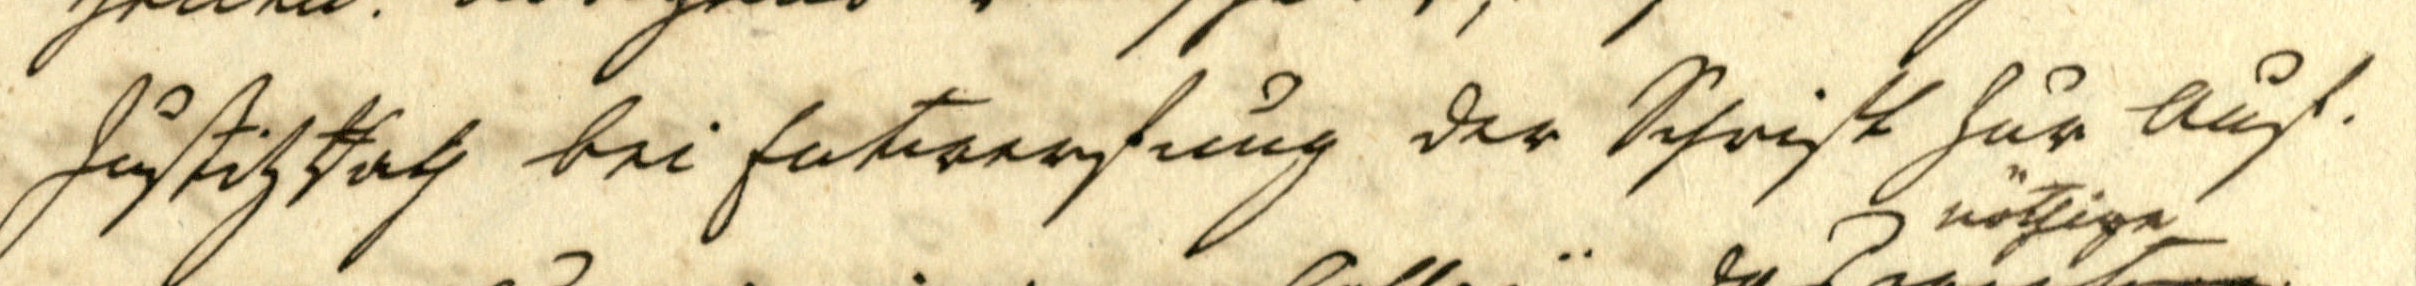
Justiz Rath bei Entwerfung der Schrift zur Auf
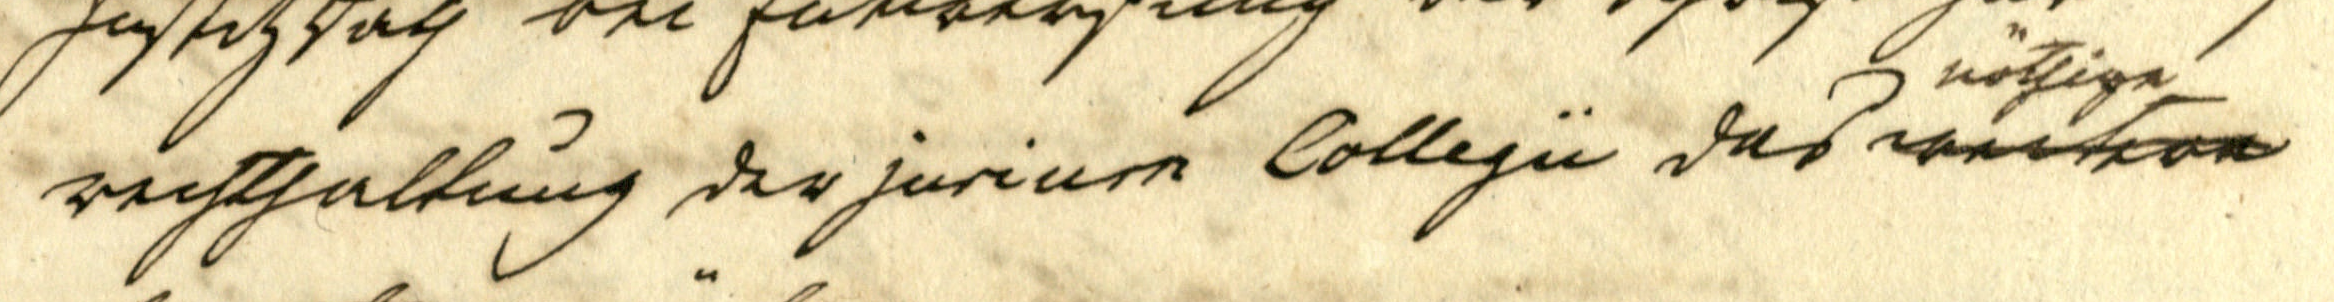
rechthaltung der jurium Collegii das nöthige weitere
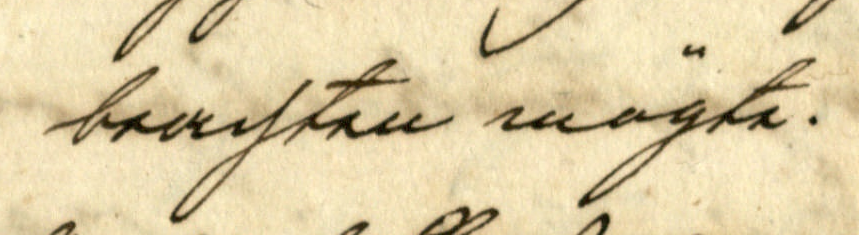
beachten mögte.
